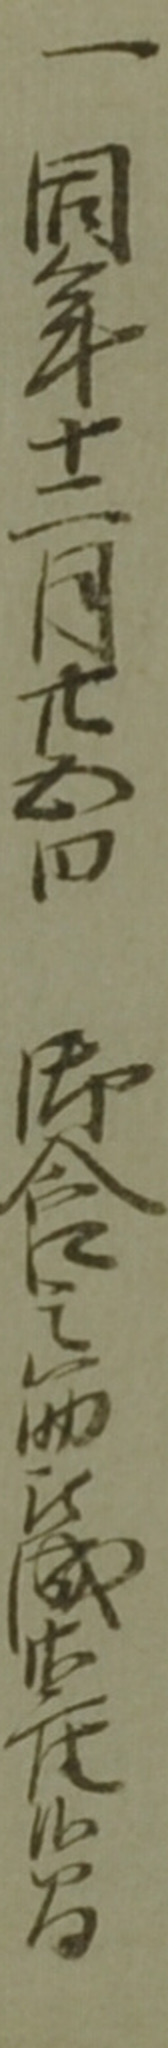一同年十二月廿五日御含之筋被成御座候間
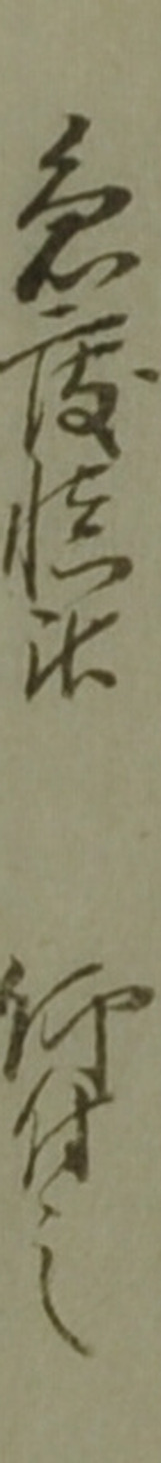急度慎被仰付之
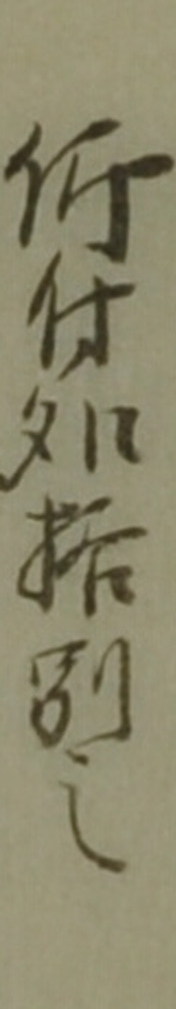仰付処格別之
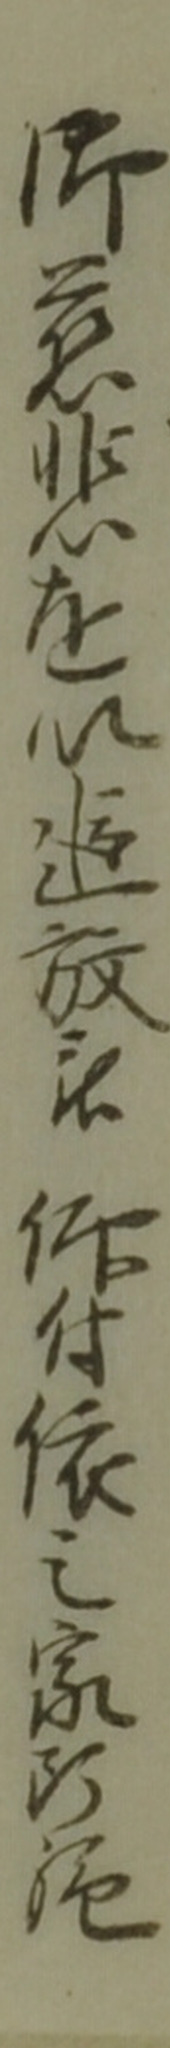御慈悲を以追放被仰付依之家断絶
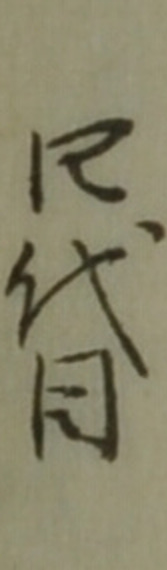四代目
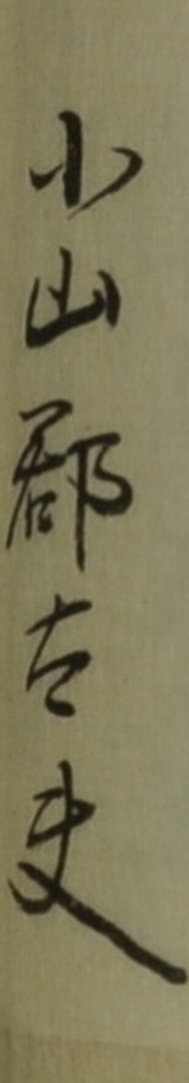小山郡太夫
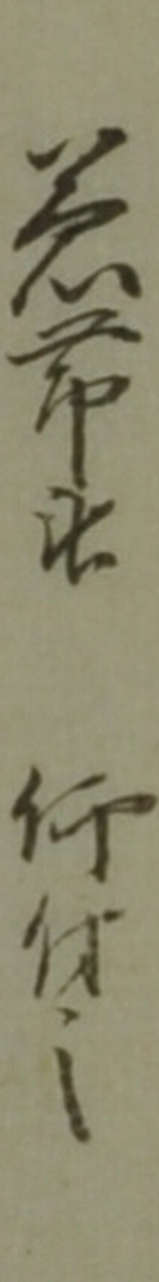兼帯被仰付之
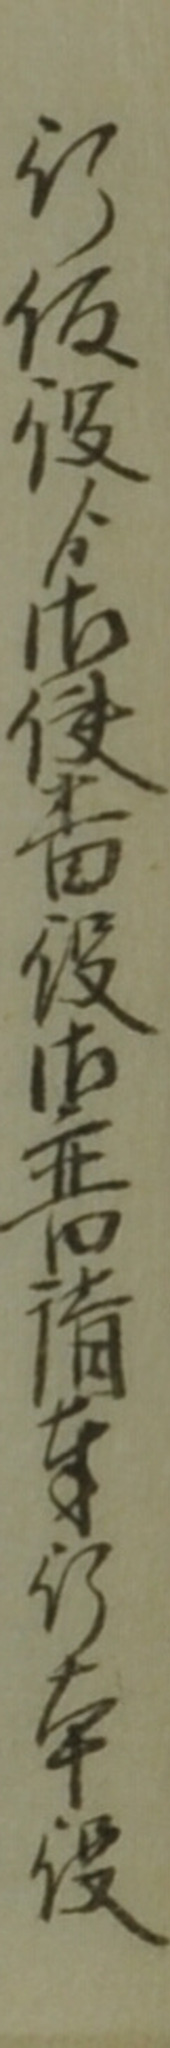行仮役ゟ御使番役御普請奉行本役
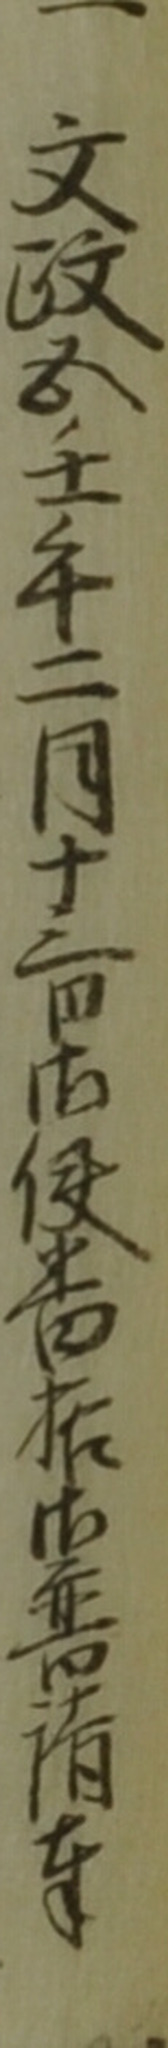一文政五壬午二月十二日御使番格御普請奉
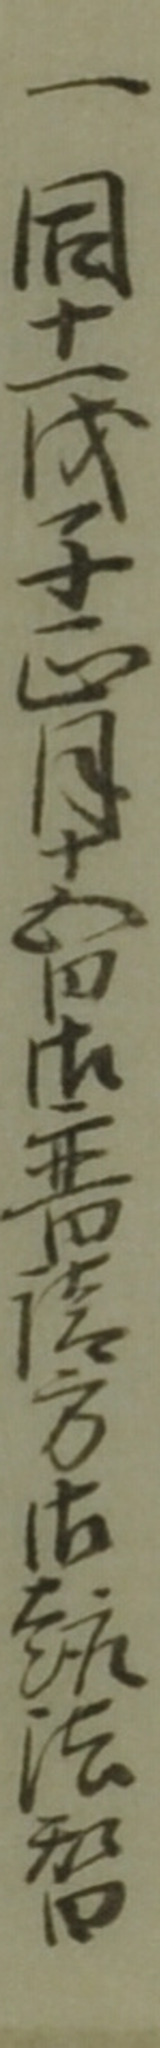一同十一戊子正月十五日御普請方御趣法替
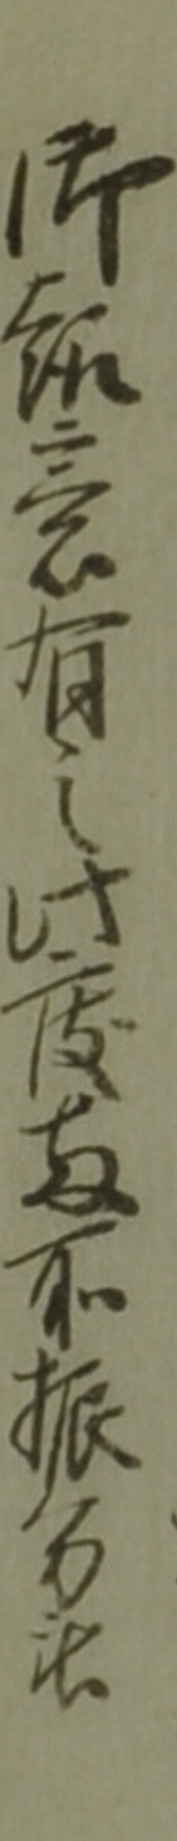御趣意有之此度両取振分被
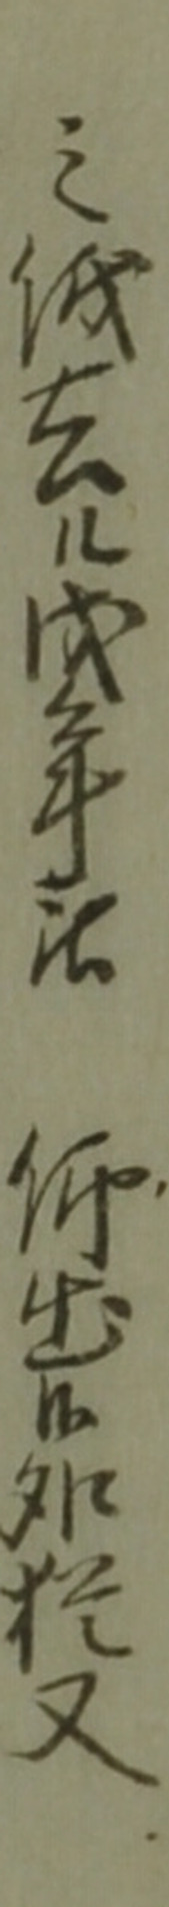之儀去ル戌年被仰出候処猶又
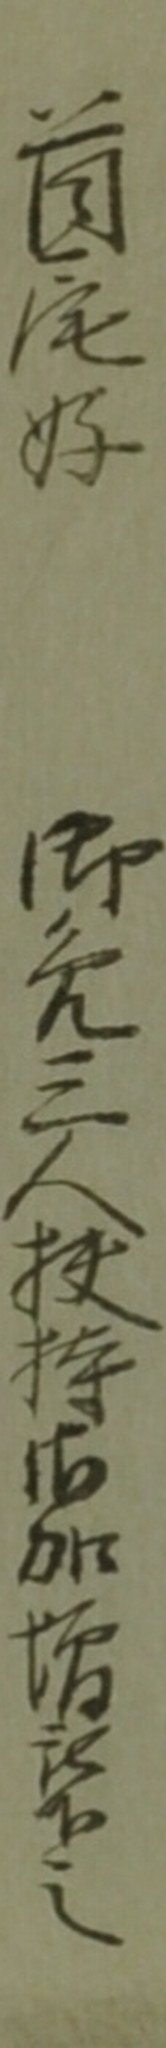首尾好御免三人扶持御加増被下之
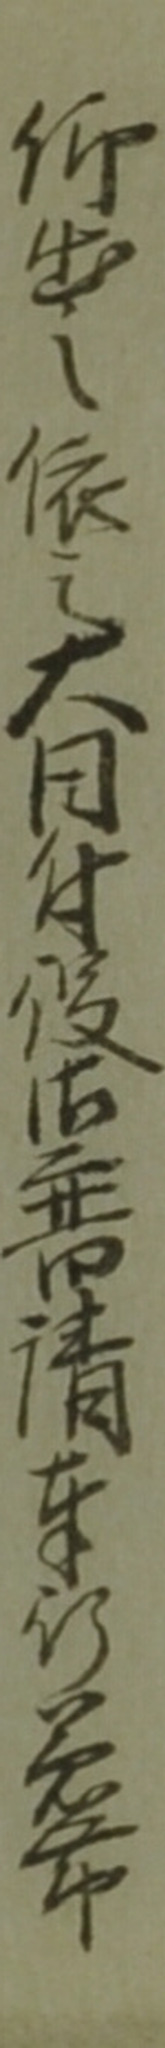仰出之依之大目付役御普請奉行兼帯
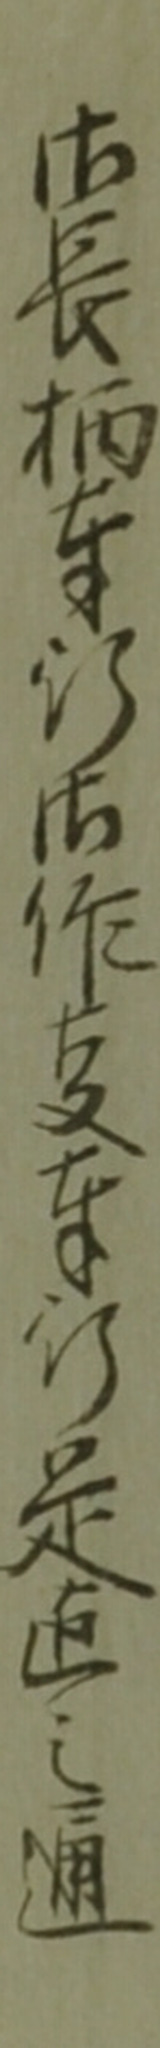御長柄奉行御作事奉行是迄之通
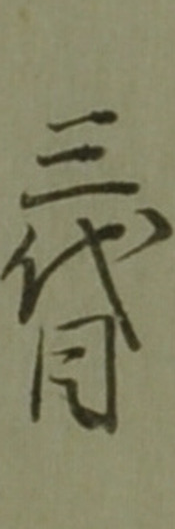三代目
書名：諸御役代々録（六）
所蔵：伊那市立高遠町図書館・合同会社AMANE
